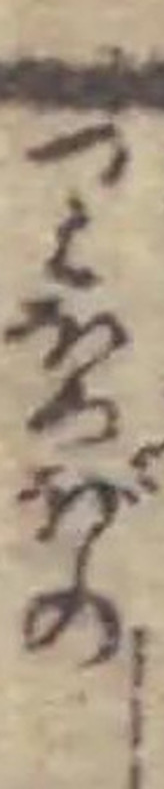つみほろぼしの
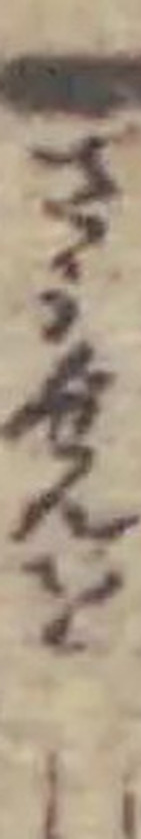さみせんを
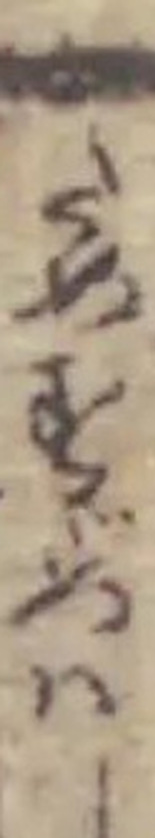ためすゞめは
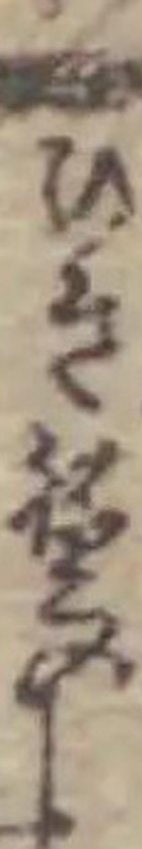ひきねこの
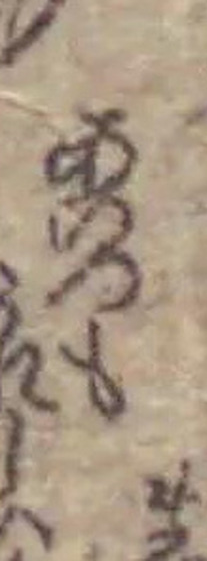あいつも
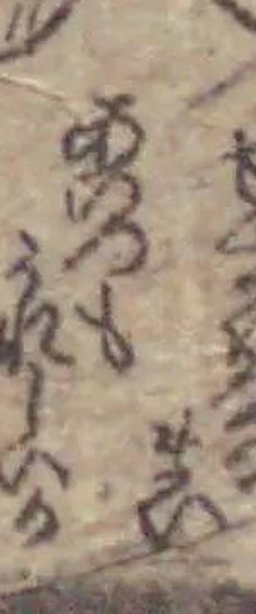あいつも
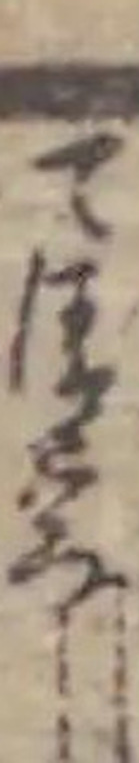て清右エ門
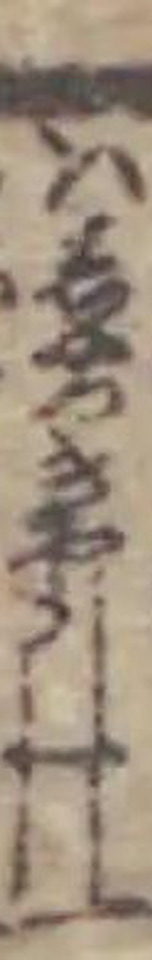はしやつきやう
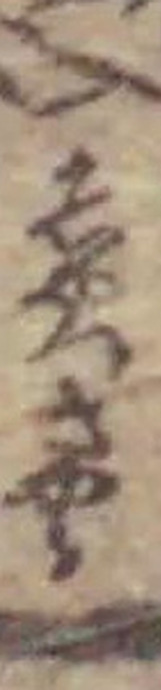しやつきやう
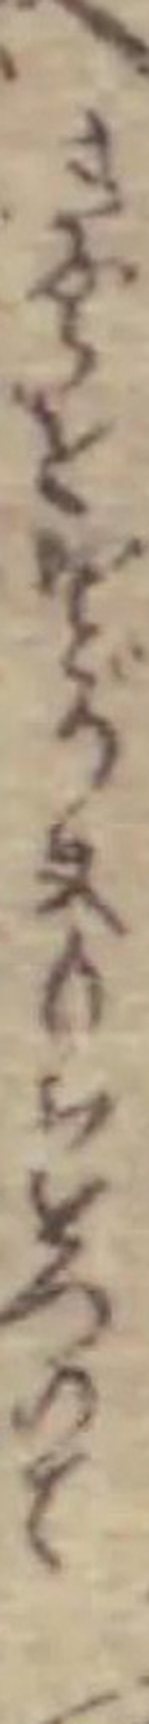きふうをおどり又もちをついて
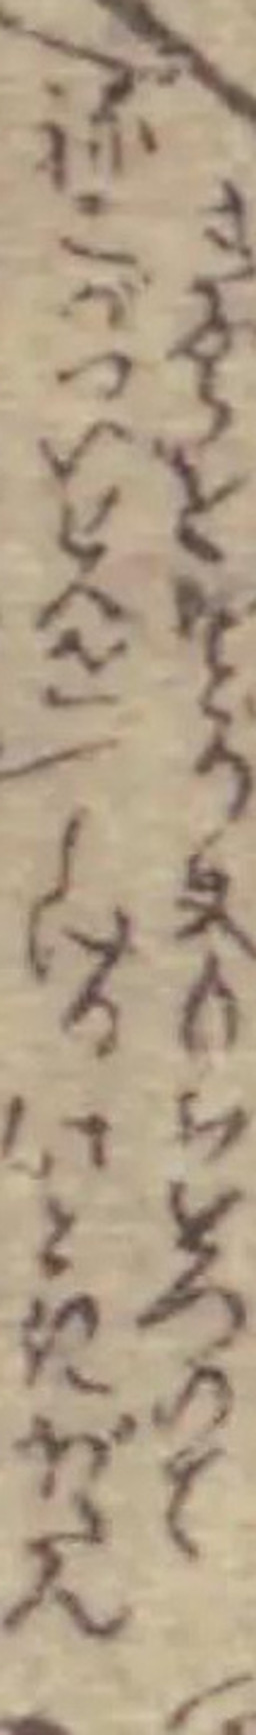ねこがついせんをしける此ときぼたん
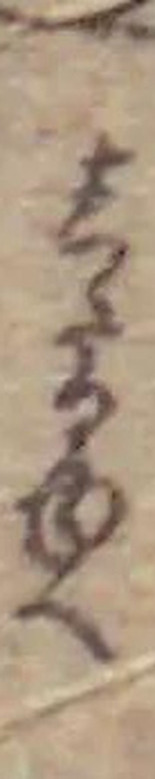したるゆへ
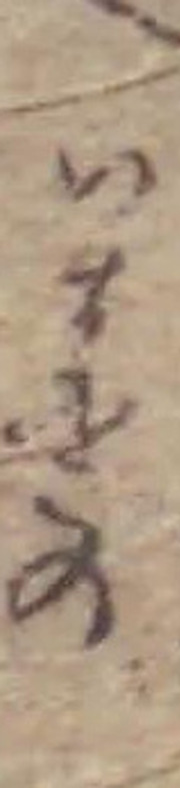いまにこの
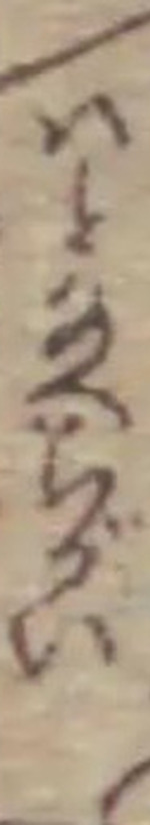はとなへちがい
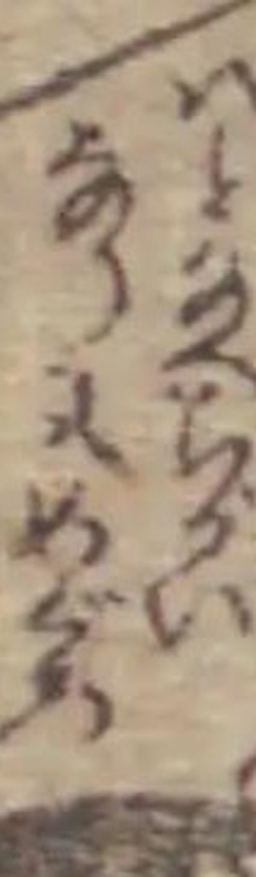なり又めぐろ
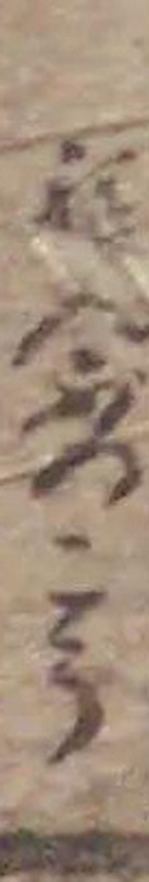ねんぶつこう
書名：冷水灰毛猫 2巻
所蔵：国立国会図書館 National Diet Library, JAPAN
